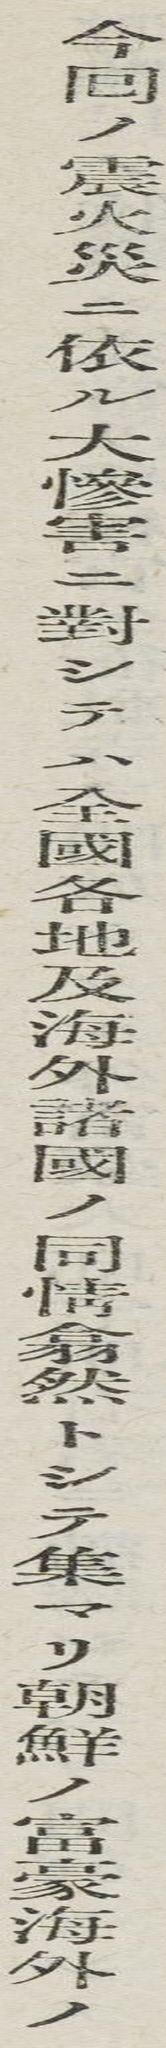今回ノ震火災ニ依ル大惨害ニ対シテハ全国各地及海外諸国ノ同情翕然トシテ集マリ朝鮮ノ富豪海外ノ
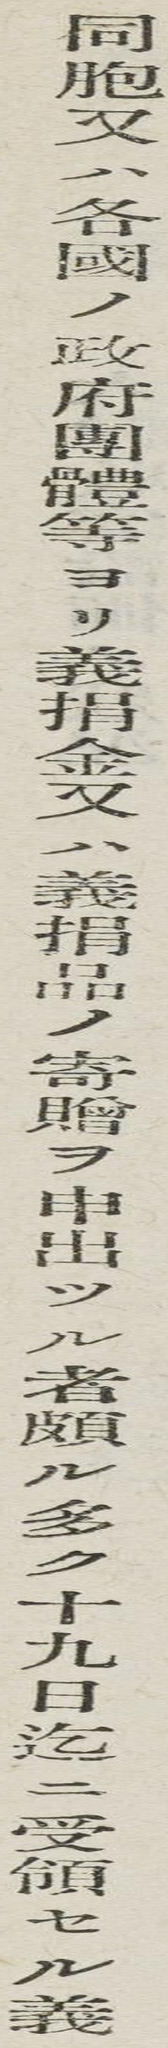同朋又ハ各国ノ政府団体等ヨリ義捐金又ハ義捐品ノ寄贈ヲ申出ツル者頗ル多ク十九日迄ニ受領セル儀
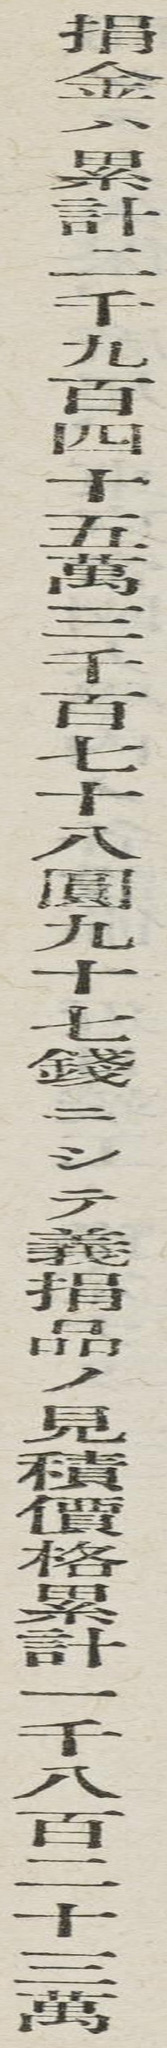捐金ハ累計二千九百四十五万三千百七十八円九十七銭ニシテ義捐品ノ見積価格累計一千八百二十三万
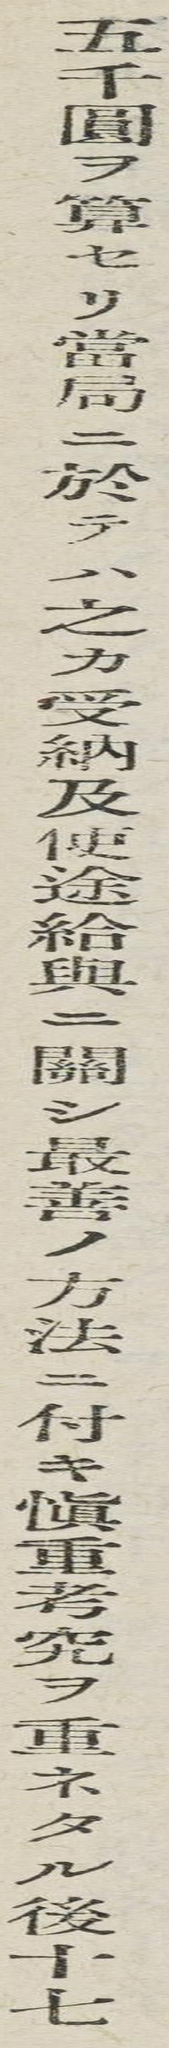五千円ヲ算セリ当局ニ於テハ之カ受納及使途給与ニ関シ最善ノ方法ニ付キ慎重考究ヲ重ネタル後十七
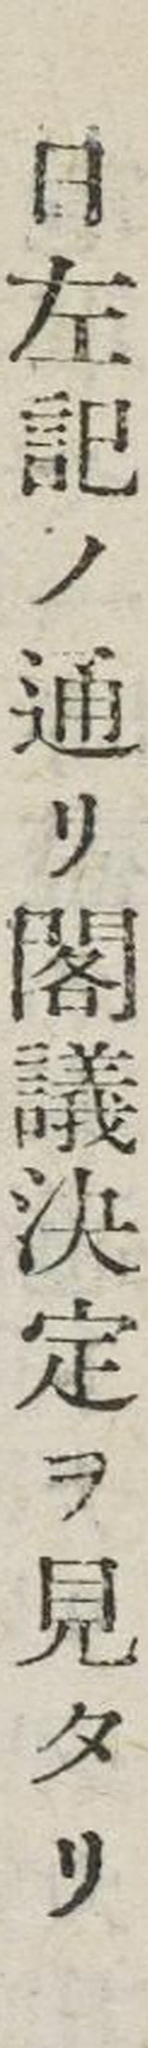日左記ノ通リ閣議決定ヲ見タリ
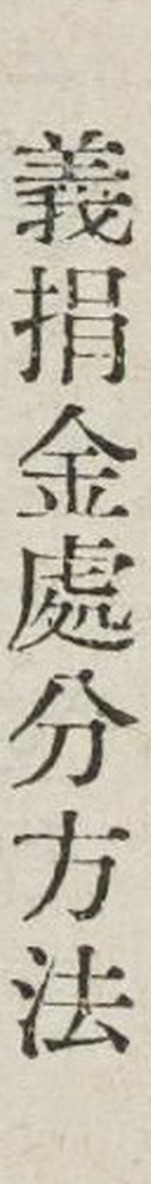義捐金処分方法
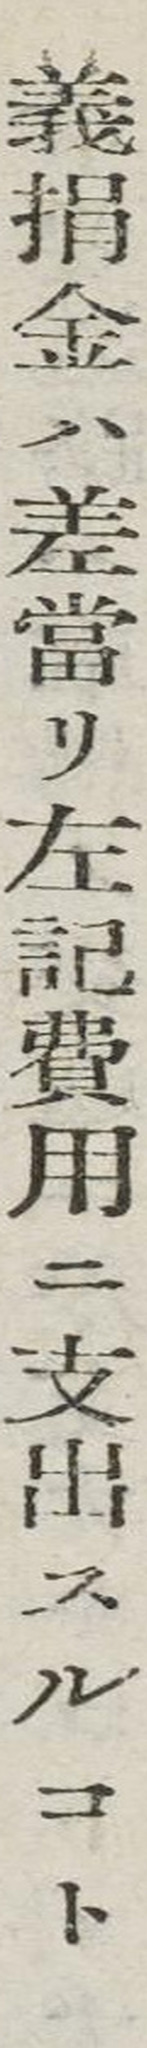義捐金ハ差当リ左記費用ニ支出スルコト
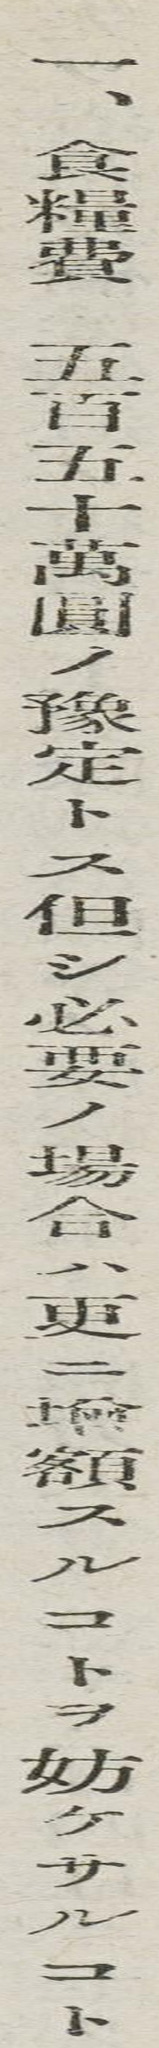一、食糧費五百五十万円ノ予定トス但シ必要ノ場合ハ更ニ増額スルコトヲ妨ケサルコト
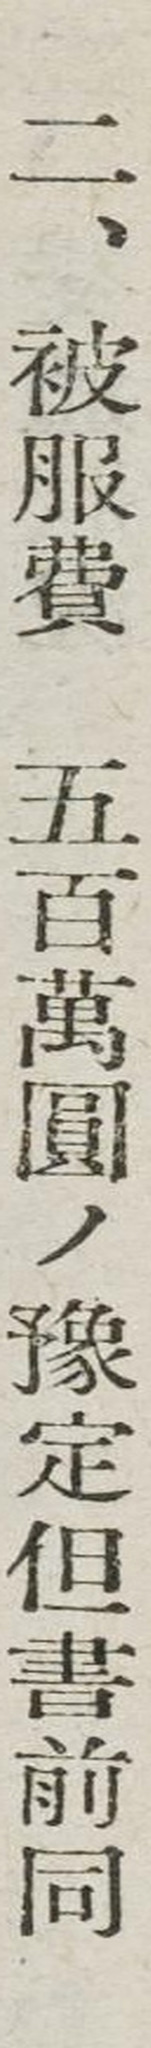二、被服費五百万円ノ予定但書前同
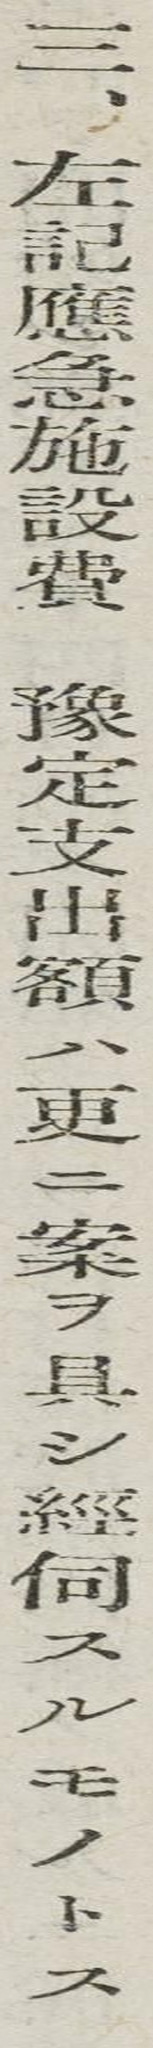三、左記応急施設費予定支出額ハ更ニ案ヲ具シ経伺スルモノトス
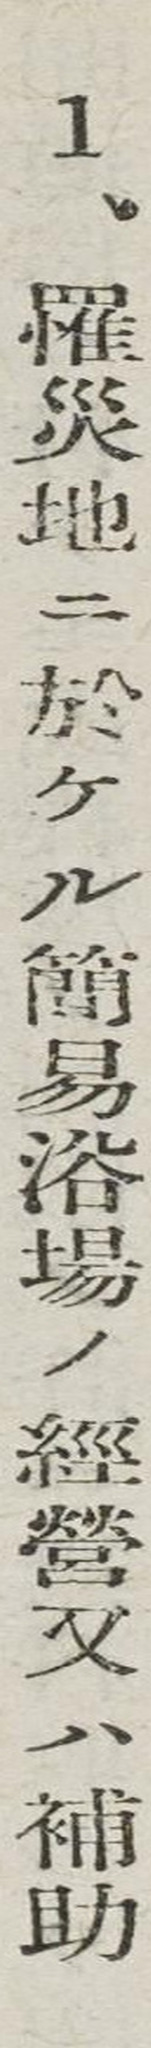１、罹災地ニ於ケル簡易浴場ノ経営又ハ補助
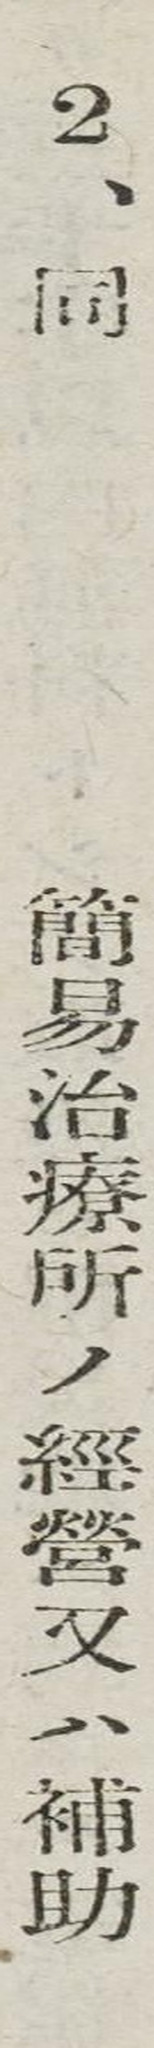２、同簡易治療所ノ経営又ハ補助
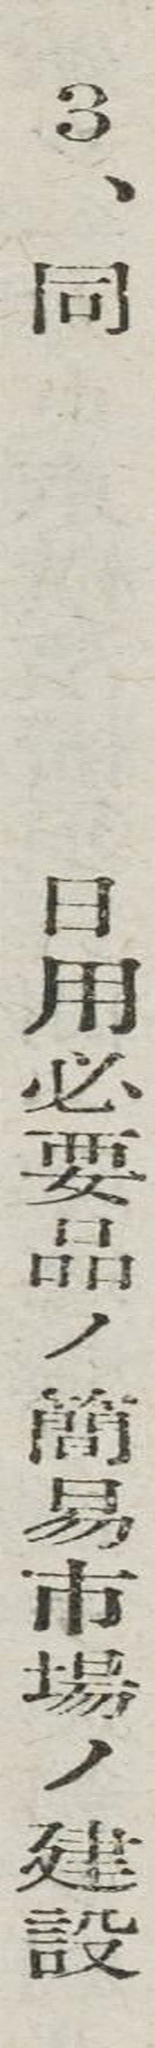３、同日用必要品ノ簡易市場ノ建設
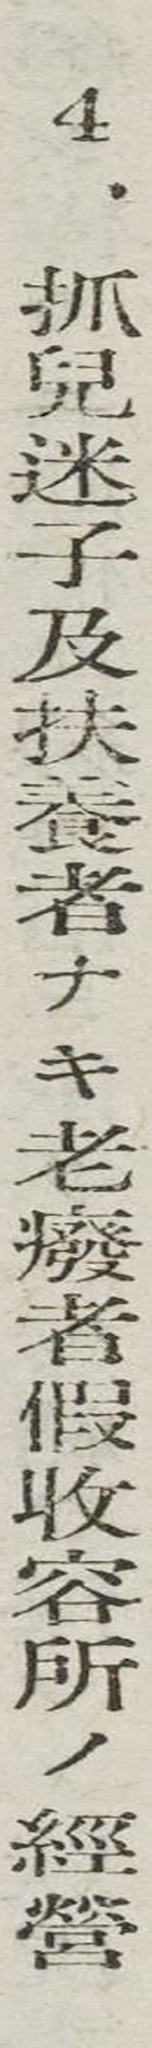４、孤児迷子及扶養者ナキ老廃者仮収容所ノ経営
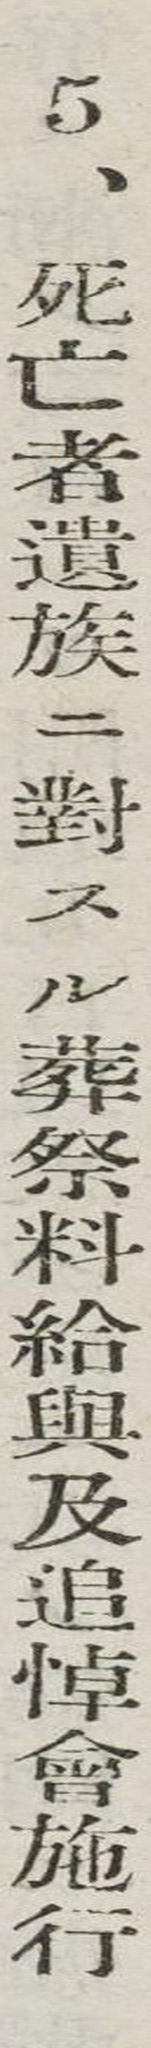５、死亡者遺族ニ対スル葬祭料給与及追悼会施行
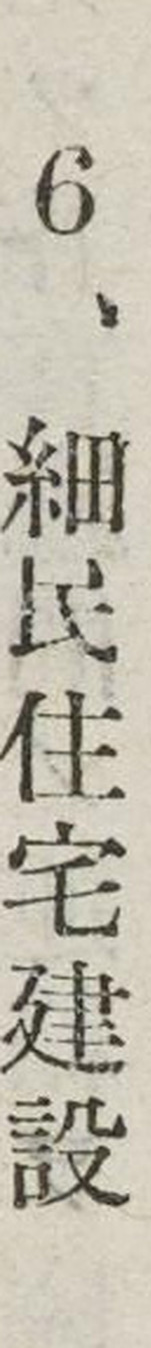６、細民住宅建設
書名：震災被害状況並救護施設概要
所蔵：東京大学地震研究所図書室 Earthquake Research Institute Library, The University of Tokyo, JAPAN
